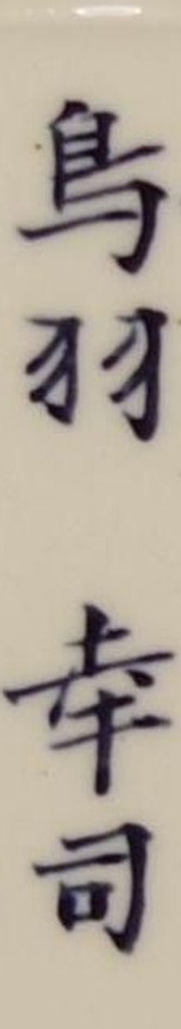鳥羽幸司
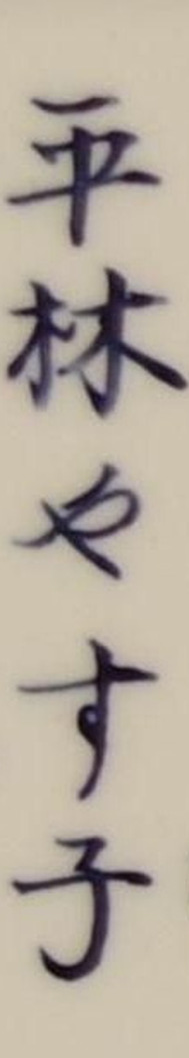平林やす子
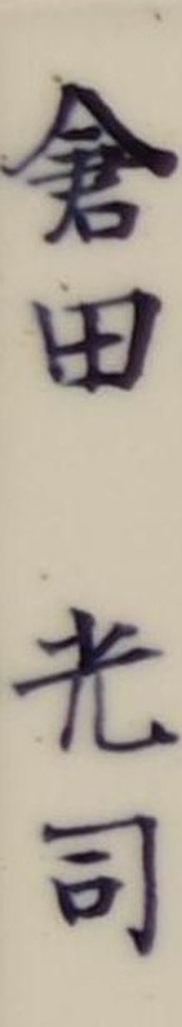倉田光司

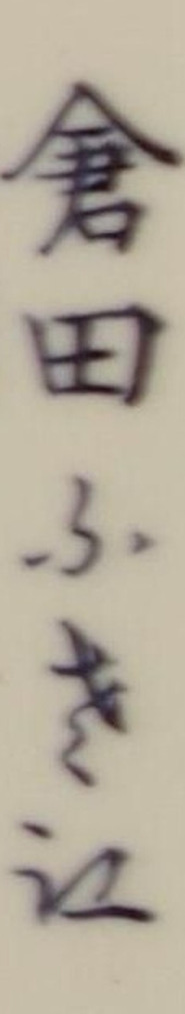倉田ふき江
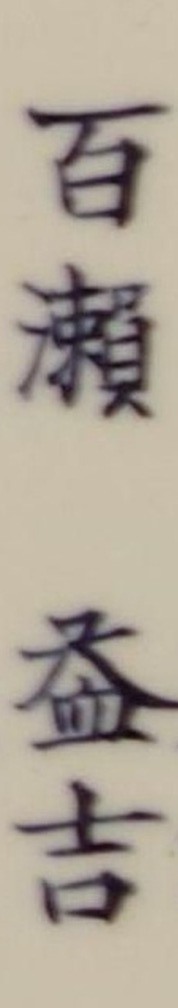百瀬益吉
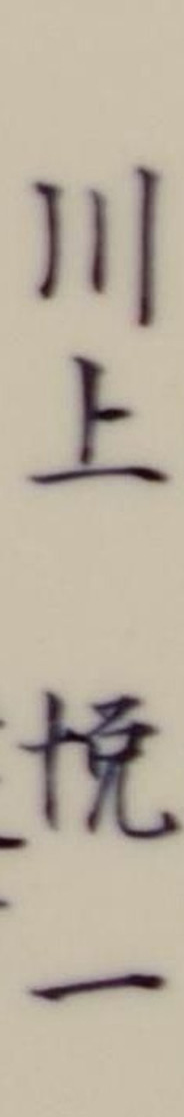川上悦一
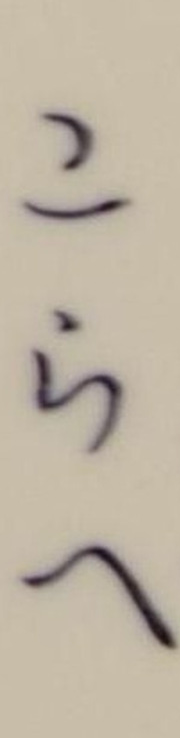こらへ
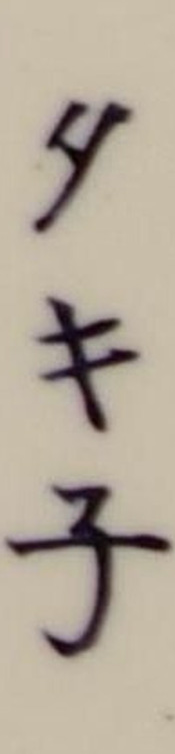タキ子
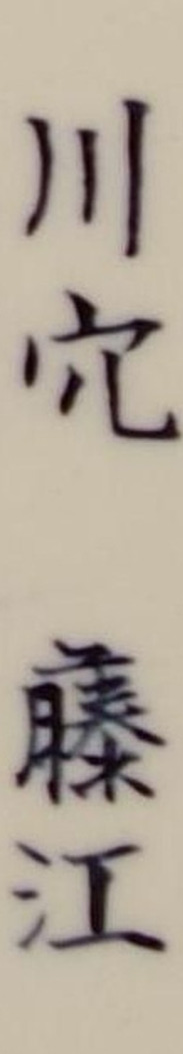川穴藤江
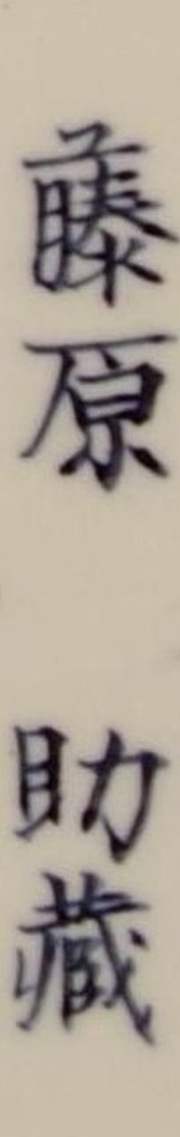藤原助蔵
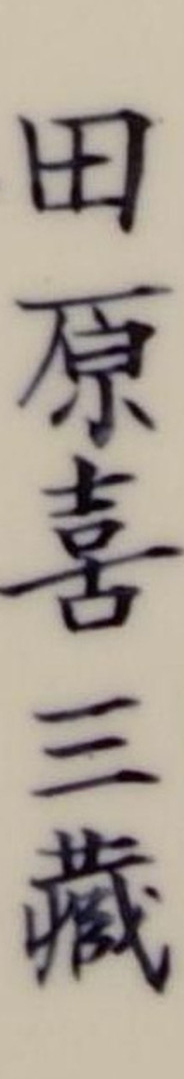田原喜三蔵
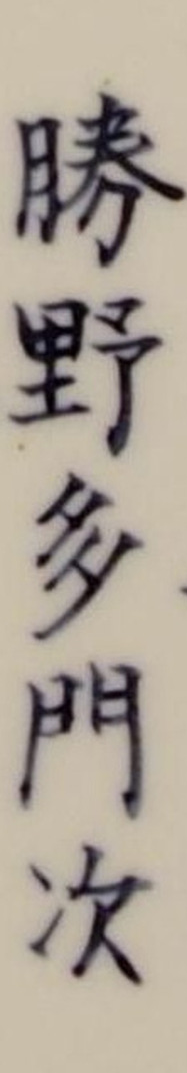勝野多門次
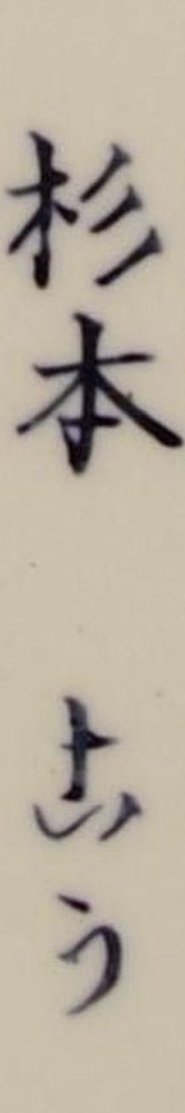杉本こう
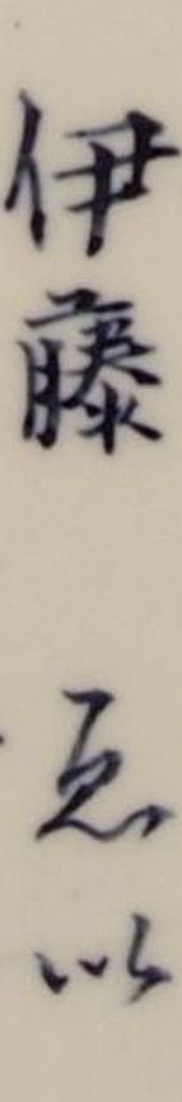伊藤ゑい
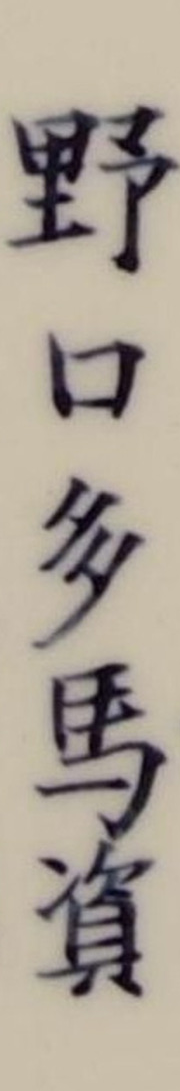野口多馬資
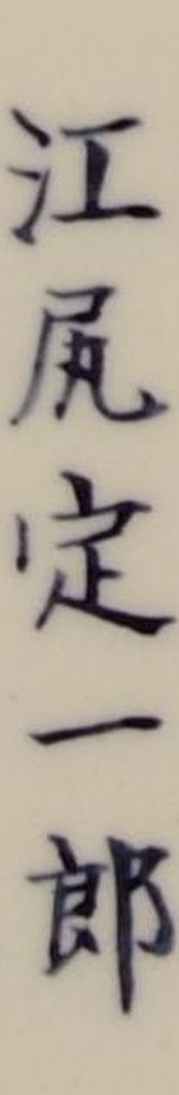江尻定一郎
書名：M~S
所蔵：高野山金剛峯寺
